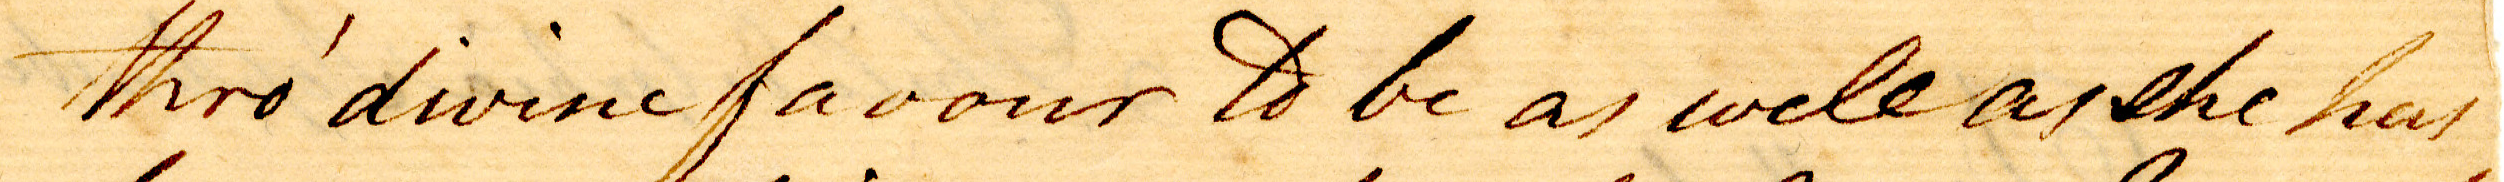thro' divine favour to be as well as she has
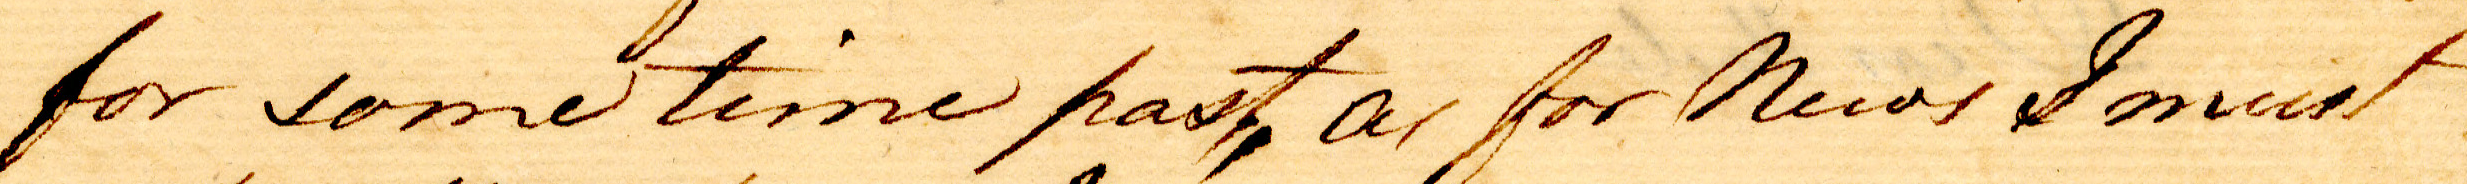for some time past, as for News I must
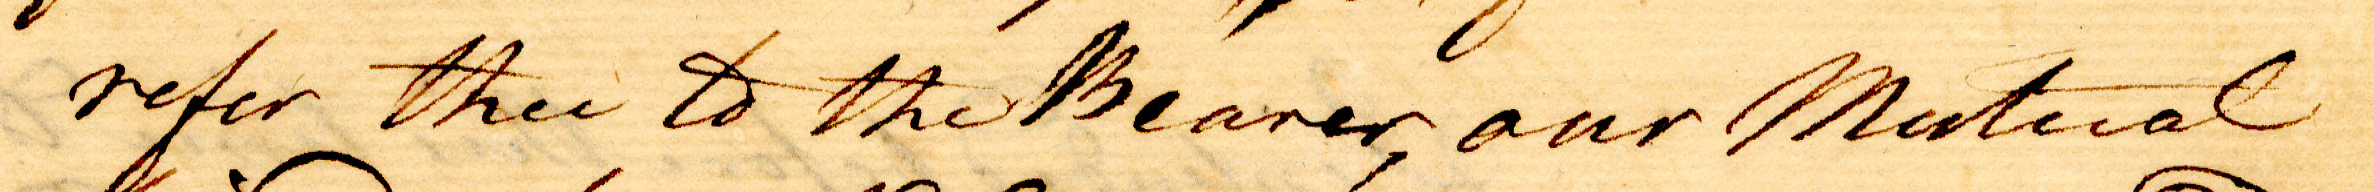refer thee to the Bearer, our Mutual
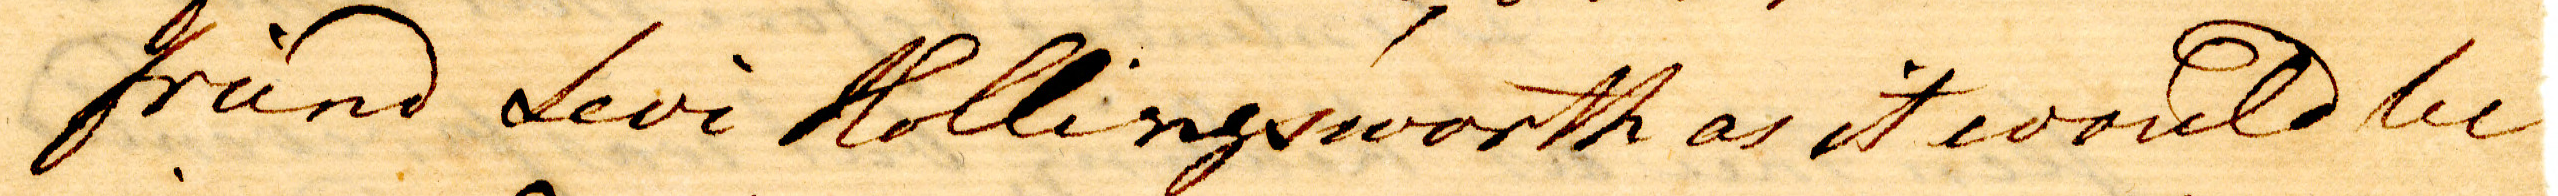friend Levi Hollingsworth as it would be
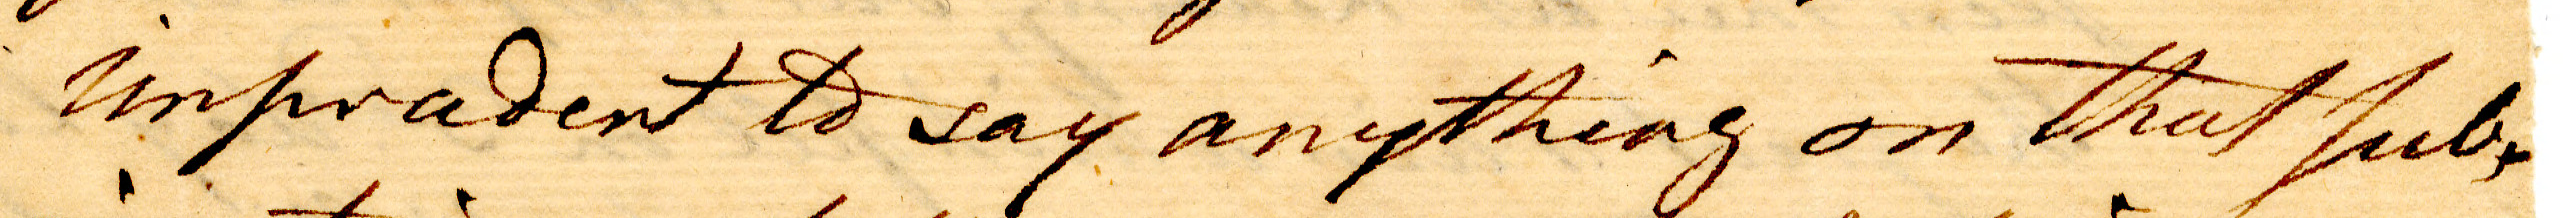imprudent to say anything on that sub-
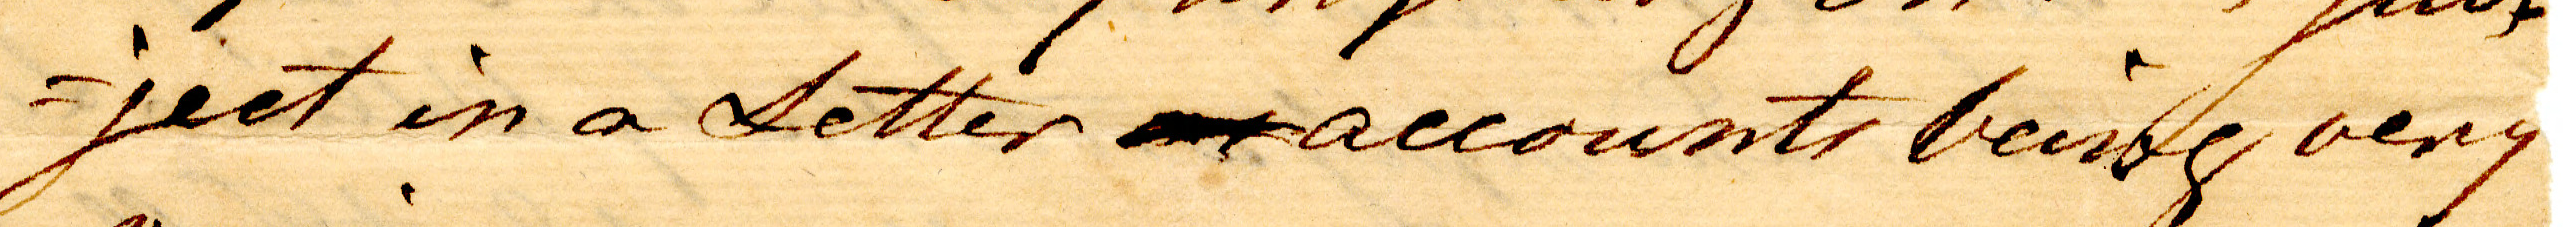-ject in a Letter accounts being very
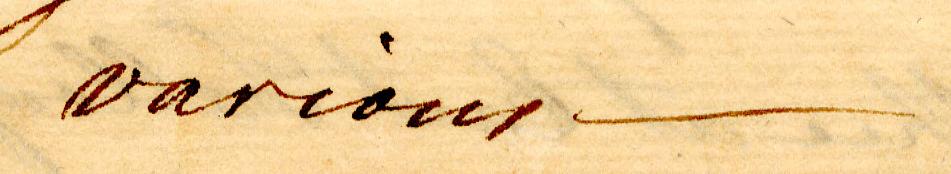various-
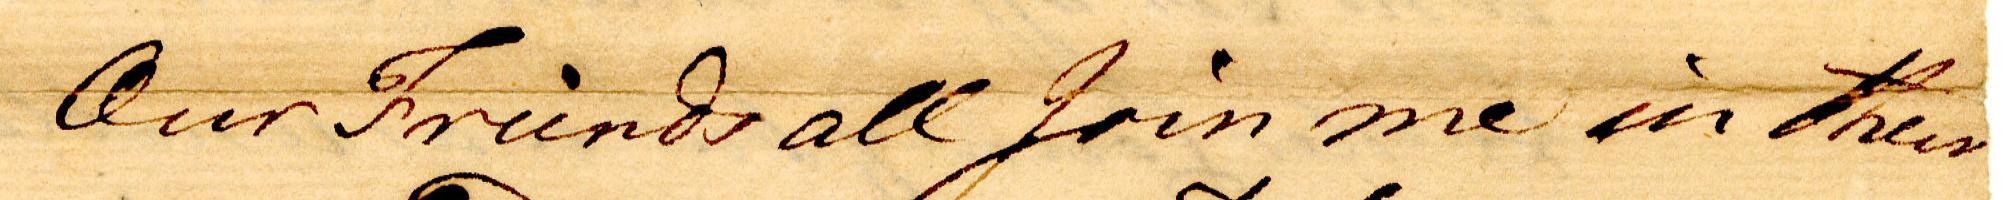Our Friends all Join me in their
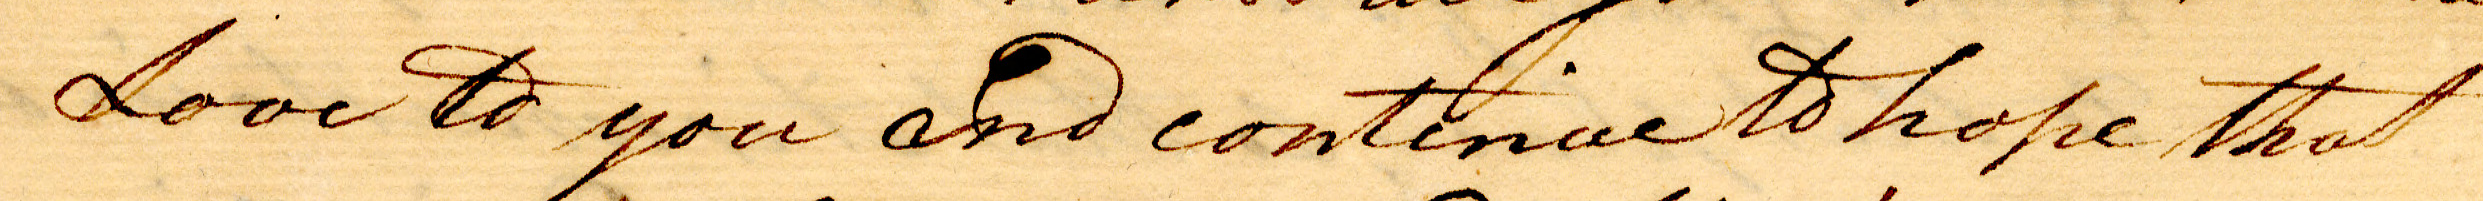Love to you and continue to hope that
